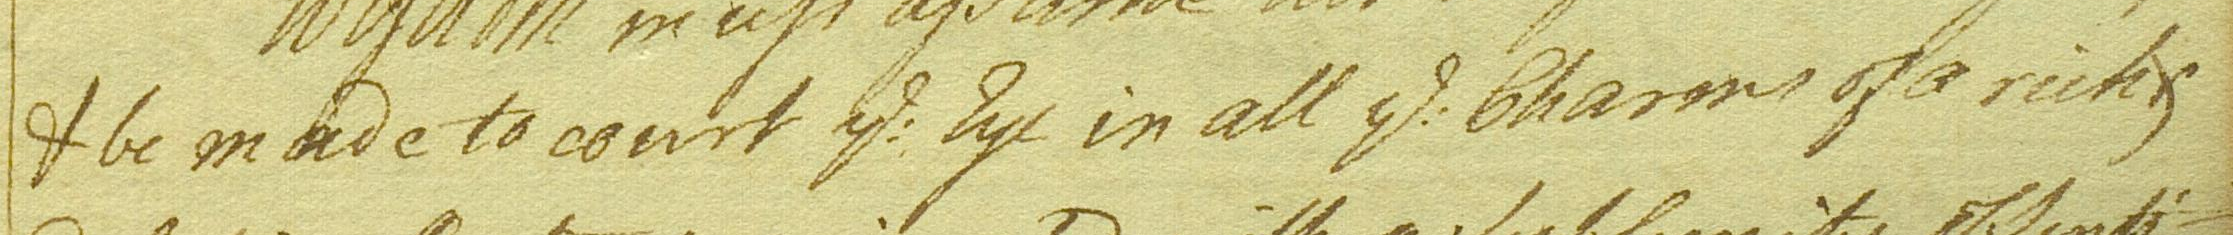& be made to court y^e: Eye in all y^e: Charmes of a rich,
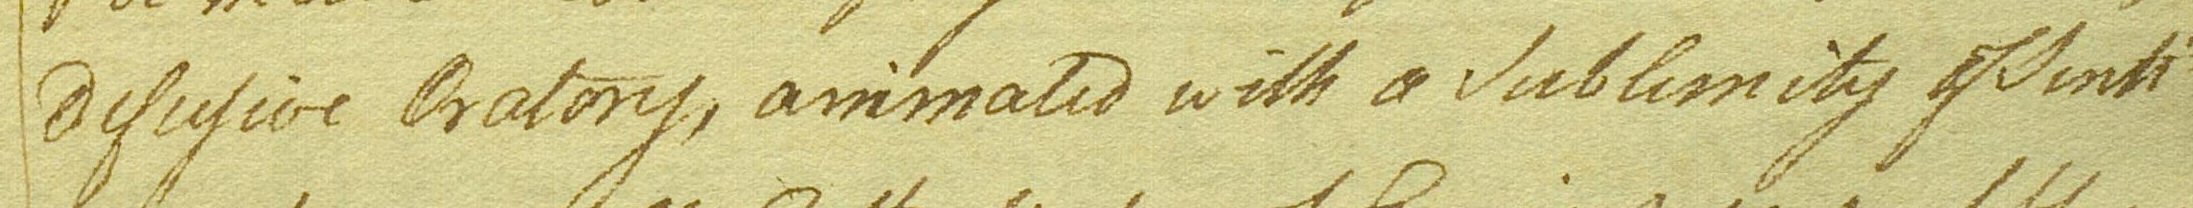Defusive Oratory, animated with a Sublimity of Senti-
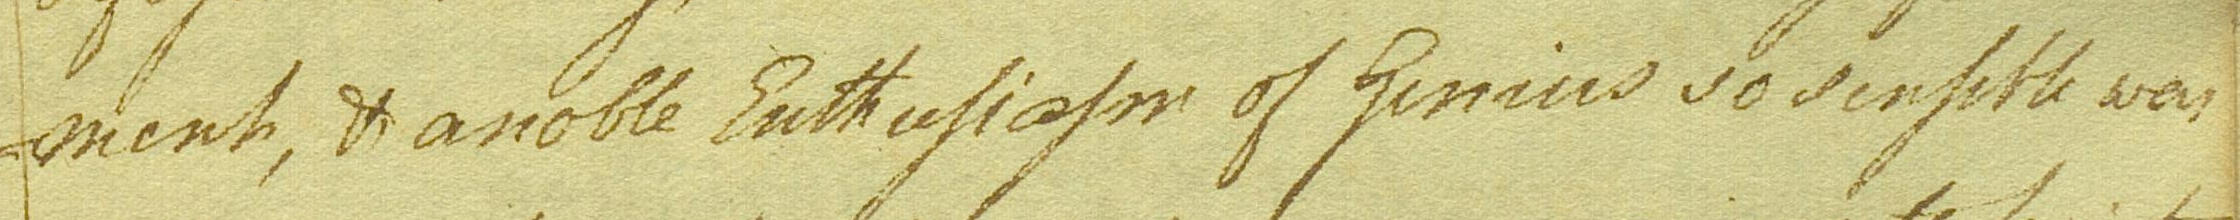ment, & a noble Enthusiasm of Genius so sensible were
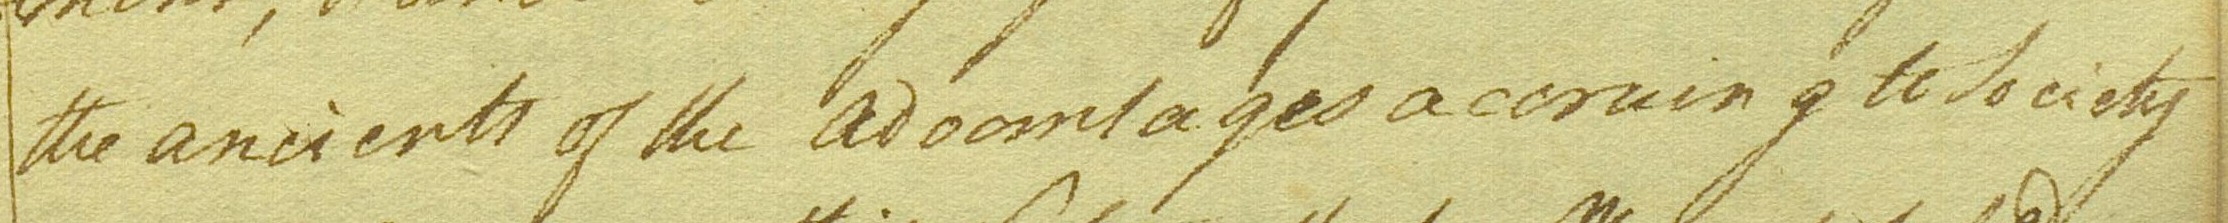the ancients of the Advantages accruing to Society
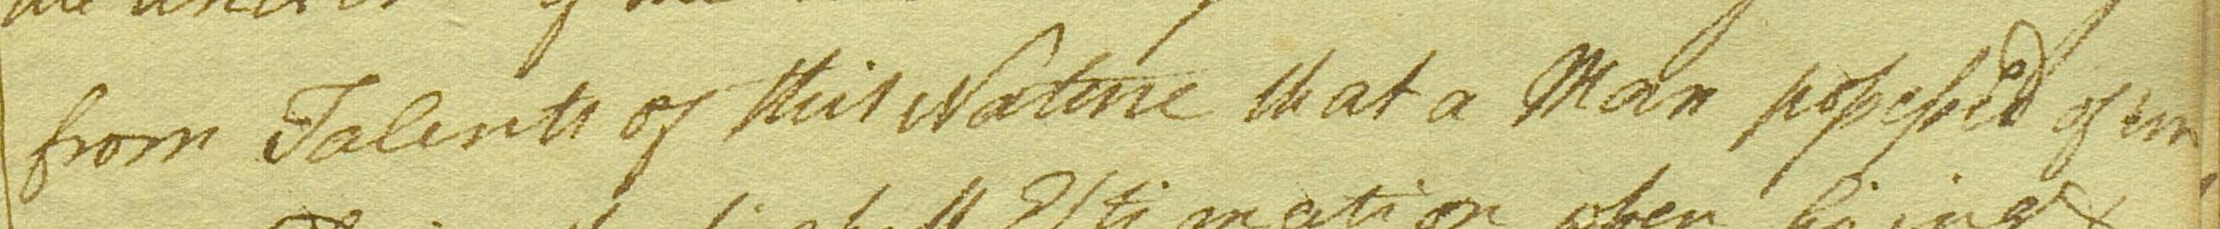from Talents of their Nature that a Man possessed of them
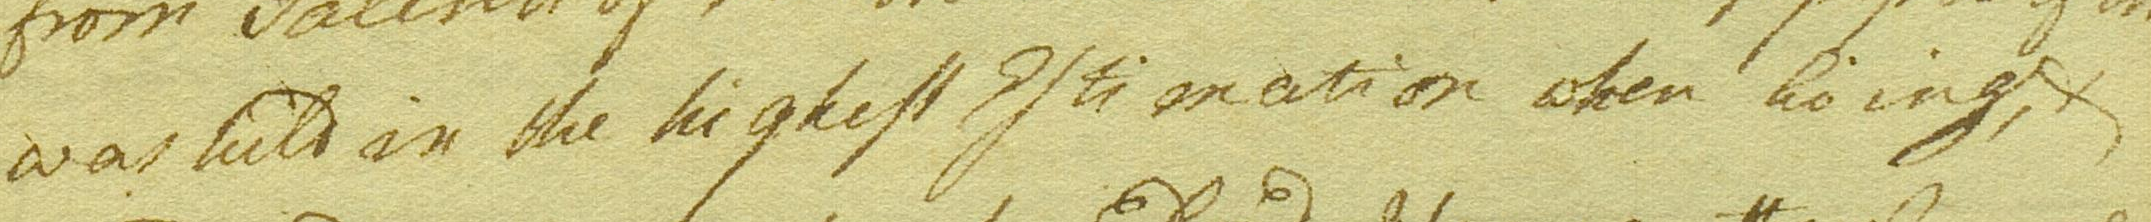was held in the hiegest Estimation when living &
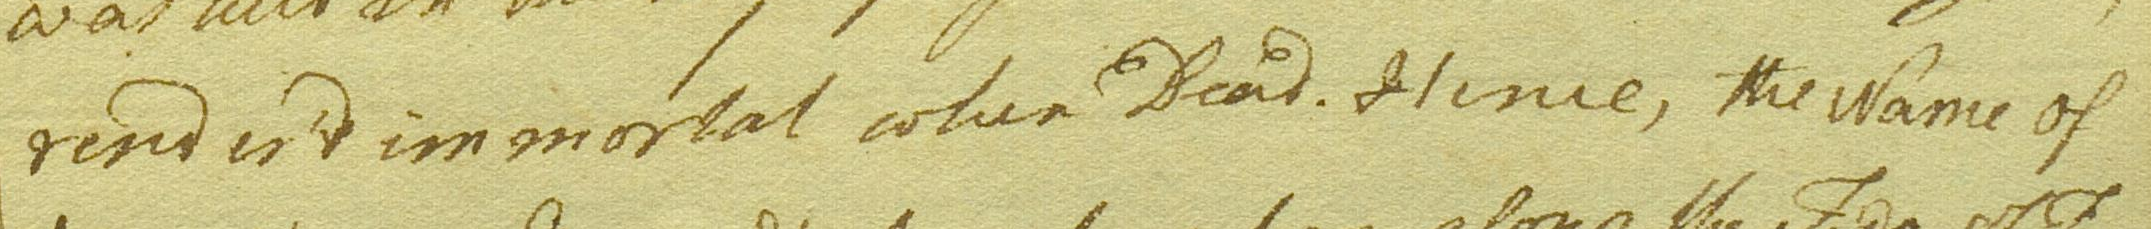render'd immortal when Dead. Hence, the Name of
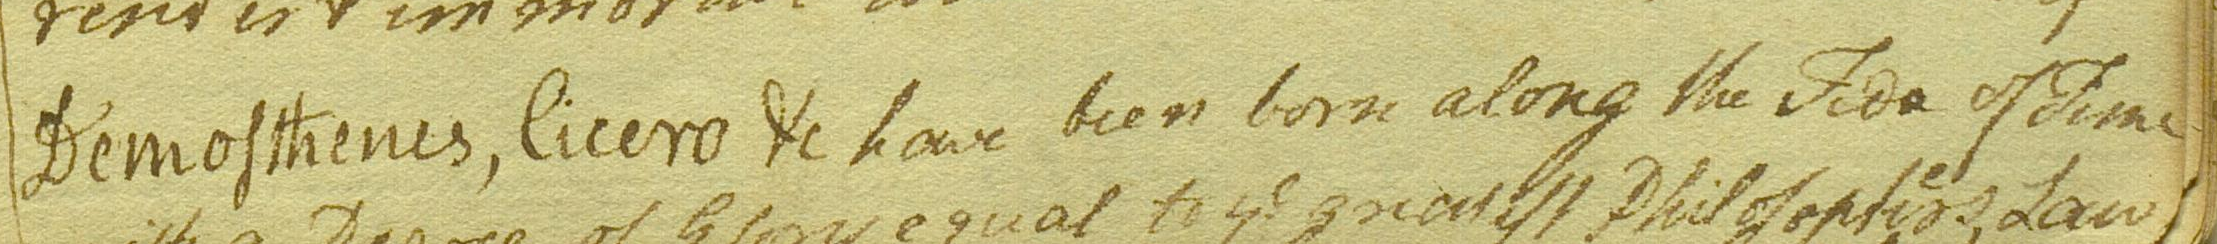Demosthenes, Cicero &c have been born along the Tide of Time
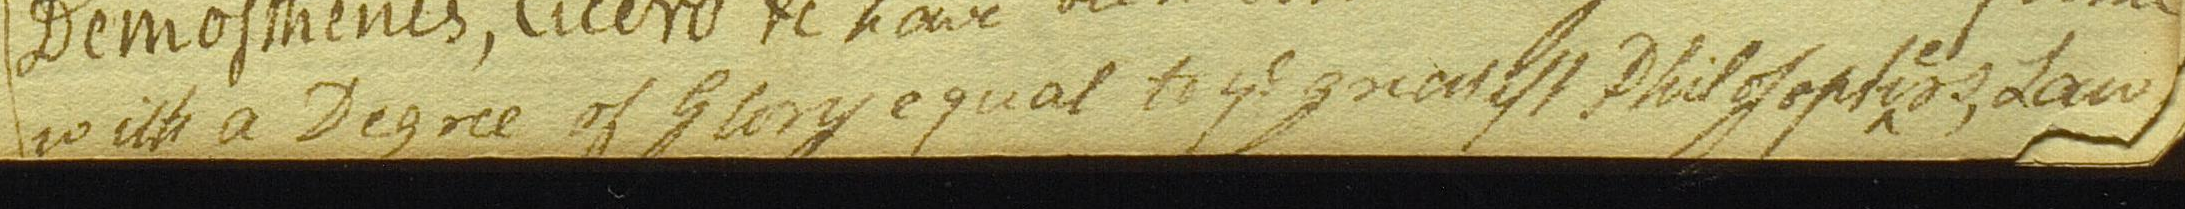with a Degree of Glory equal to y^e greatest Philosoph^ers, Law
